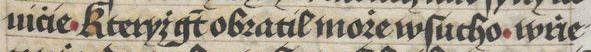uiċíe.Kteryż ḡt obratil moṙe wſucho.wṙie¬
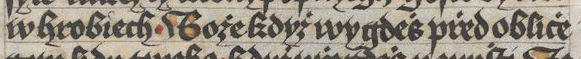w hrobiech.Boże kdyż wygdes pṙed obliċe¬
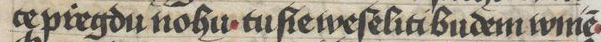ce pṙegdu nohu.tu ſie weſeliti budem wniē
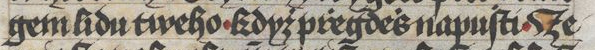gem lidu tweho.kdyż pṙegdeṡ napuẛti.Ze¬
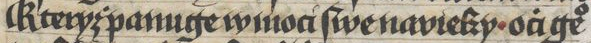Kteryż panuge w moci ſwe navieky.oċi geo
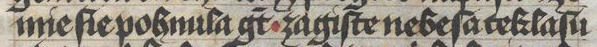mie ſie pohnula ḡt.zagiſte nebeſa teklaſu
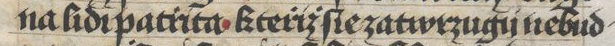na lidi patṙita.kteṙíż ſie zatwrzugij nebud¬
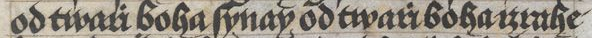od twaṙi boha ſynay od twaṙi boha izrahe¬
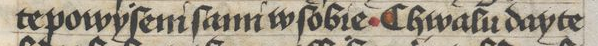te powyẛeni ſami w ſobie.Chwalu dayte
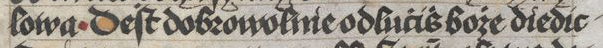lowa.Deẛt dobrowolnie odluċíṡ boże diedic¬
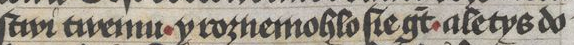ſtwi twemu.y roznemohlo ſie ḡt.ale tys do¬
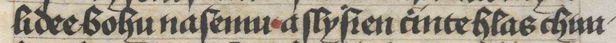lidee bohu naſemu.a ſlyẛien ċinte hlas chwa¬
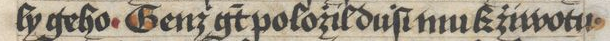ly geho.Genż ḡt polożil duẛi mu kžiwotu.
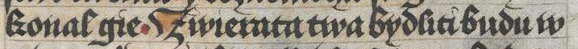konal gie.Zwierata twa bydliti budu w¬
